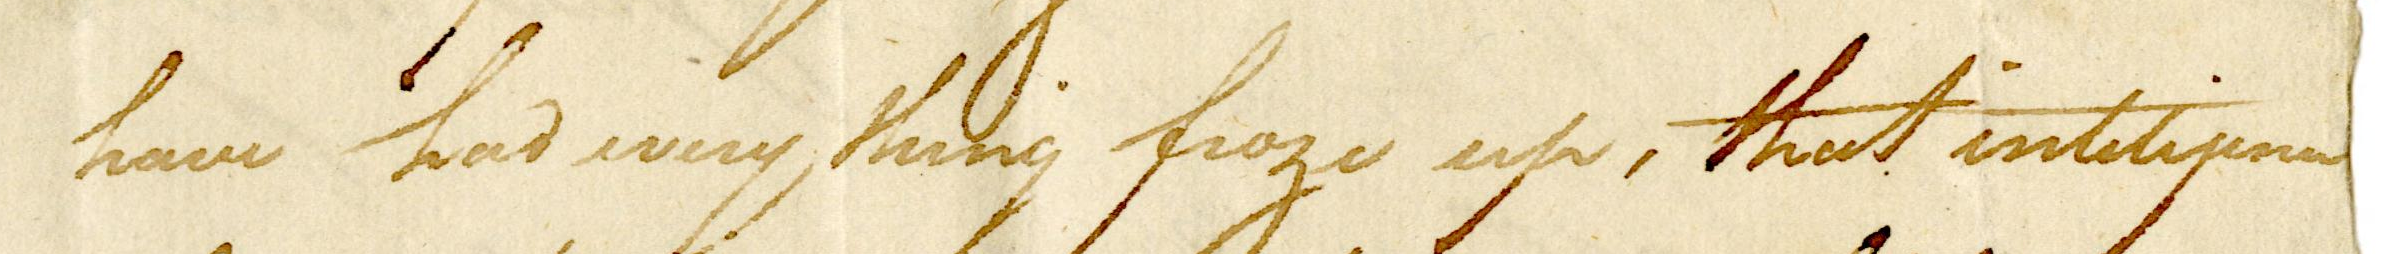have had every thing froze up, that intelligence
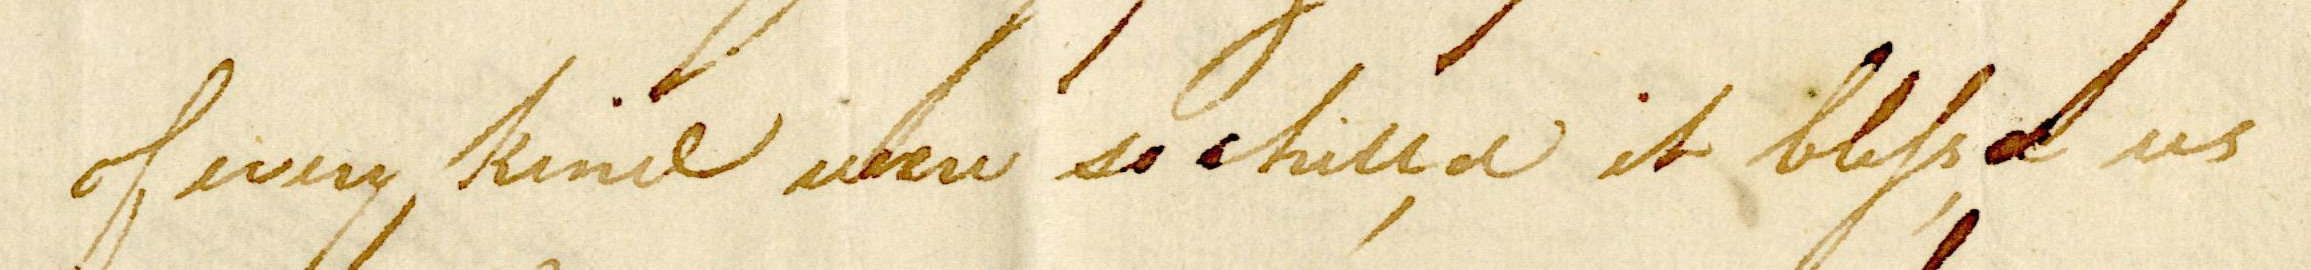of every kind when so chilled it bless'd us
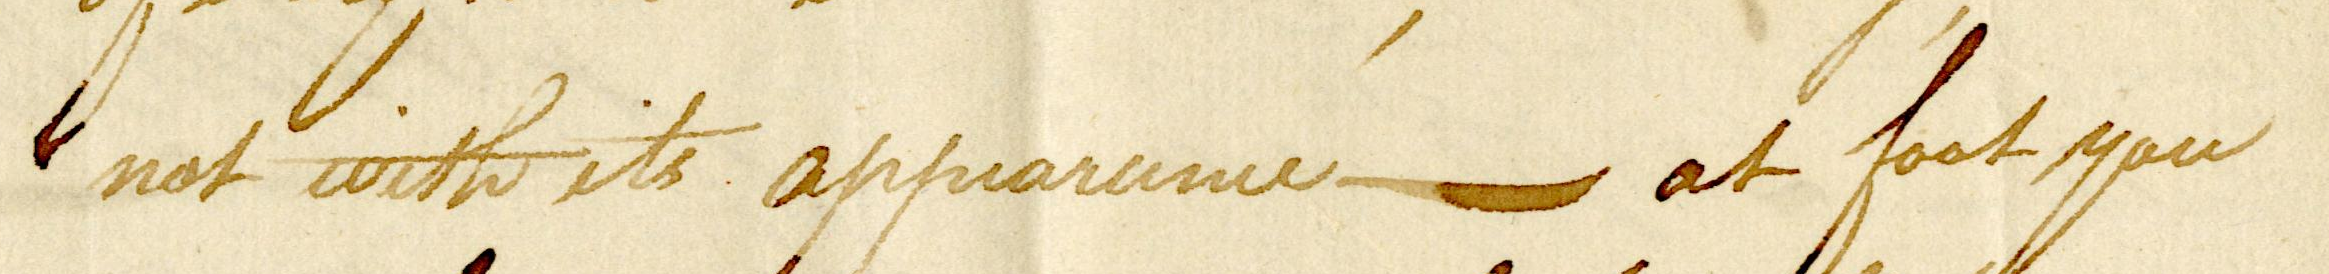not with its appearance- at fact you
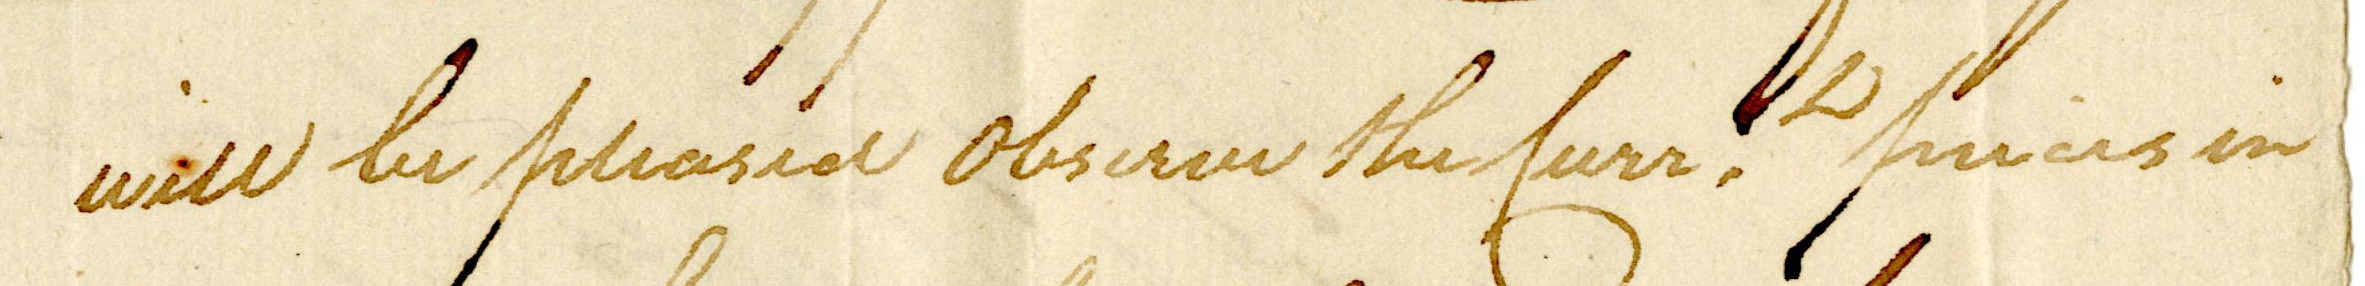will be pleased observe the Curr^t. prices in
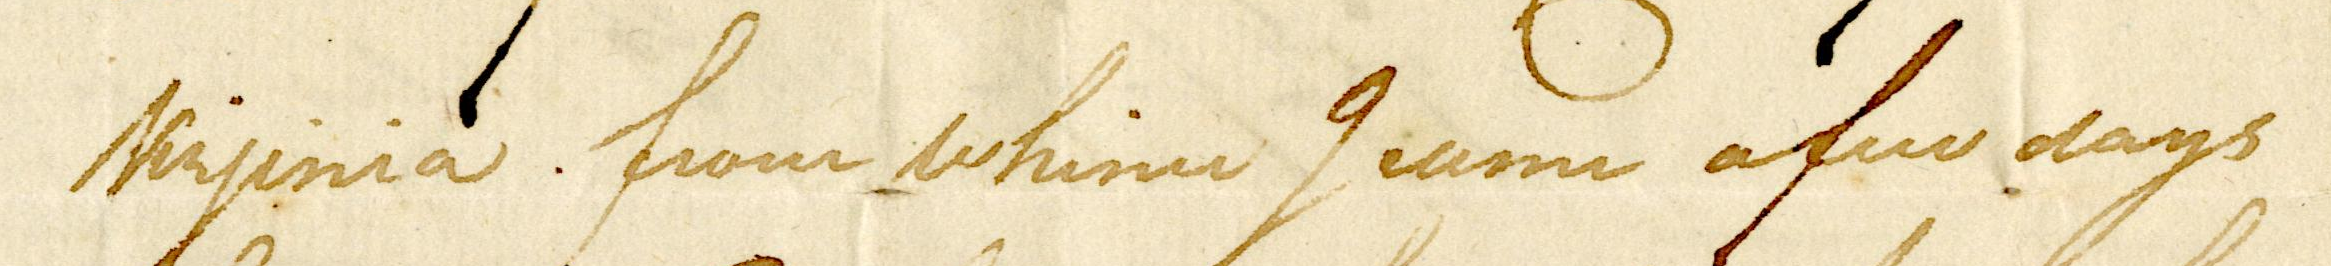Virginia from which I saw a few days
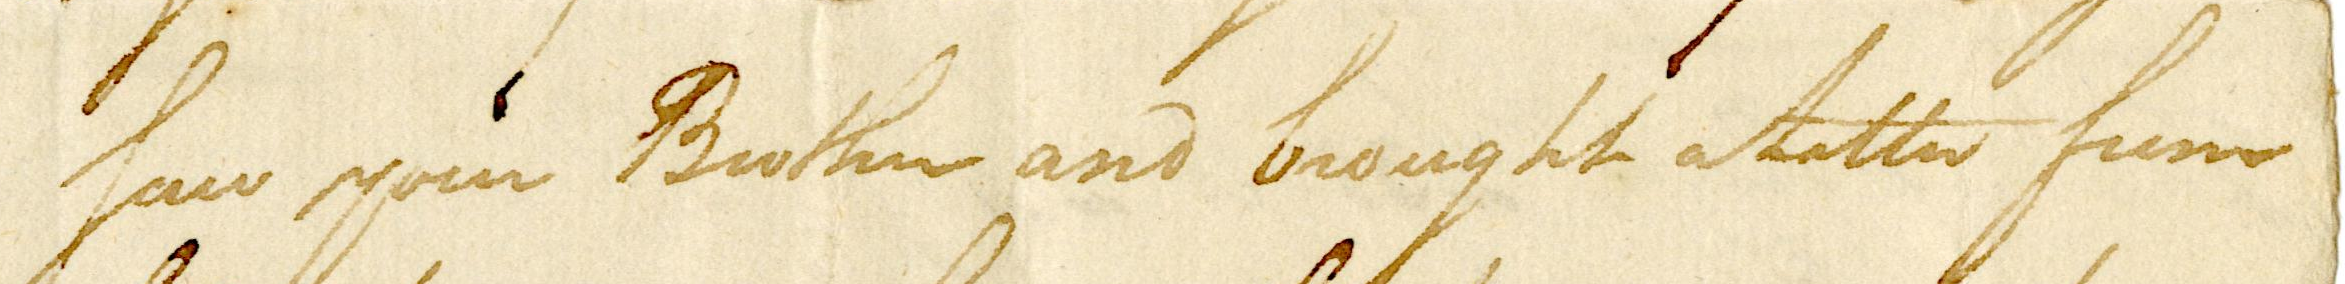for your Brother and brought a letter from
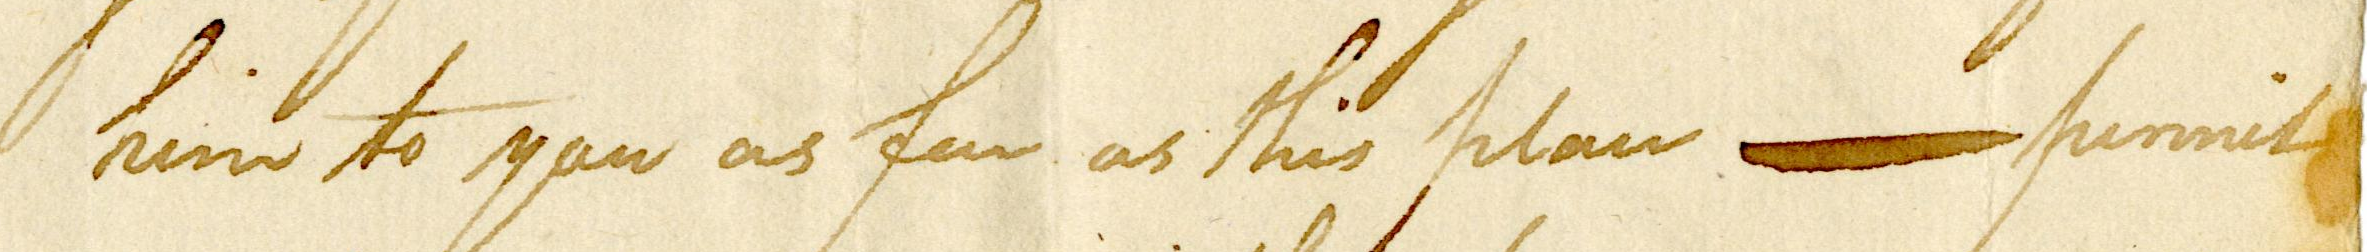him to you as few as this place- permit
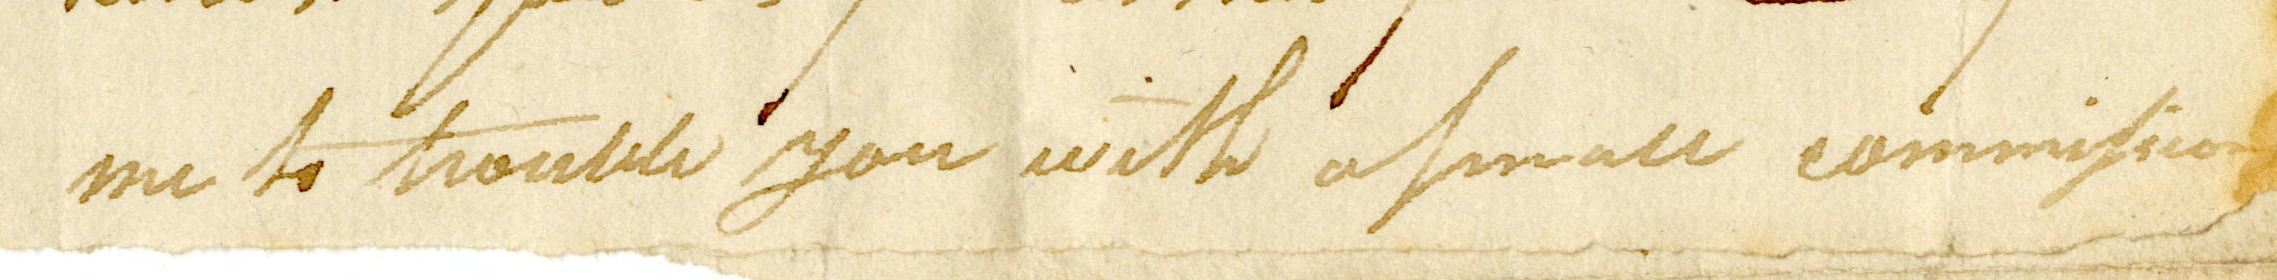me to trouble you with a small commision
